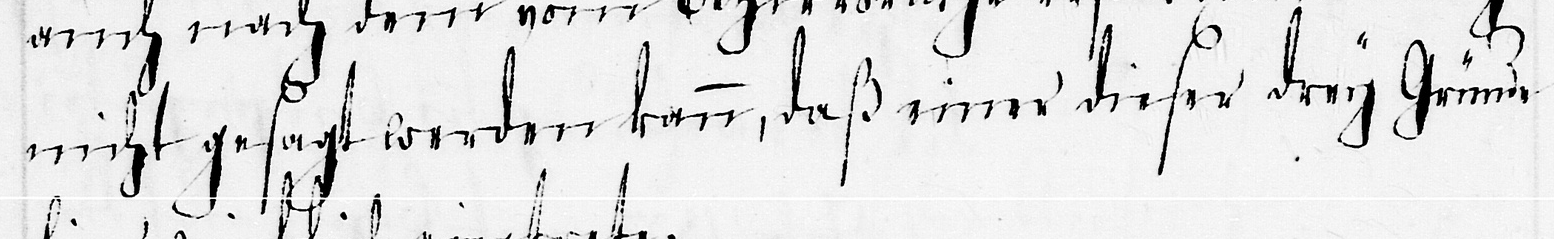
nicht gesagt werden kann, daß einer dieser drey Gründe
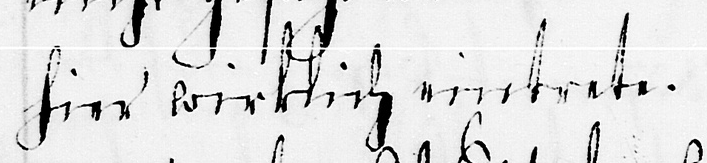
hier wirklich eintrete.
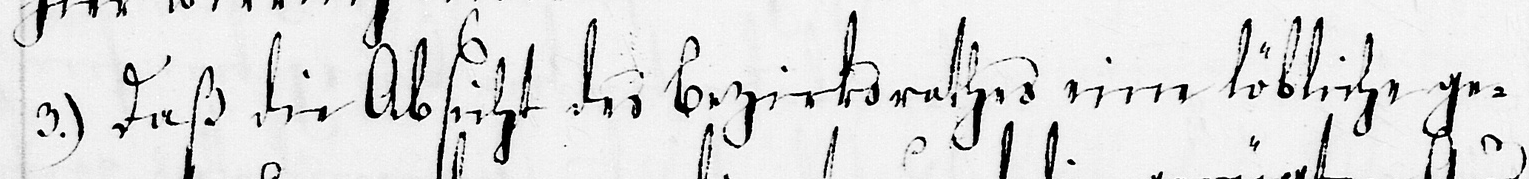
3.) Daß die Absicht des Bezirksrathes eine löbliche ge¬
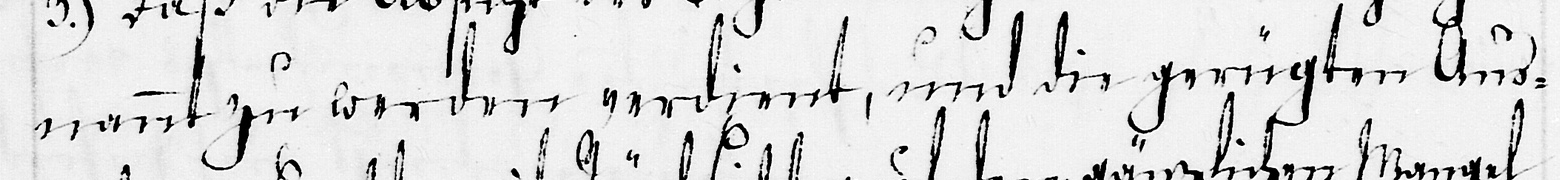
nannt zu werden verdient, und die gerügten Aus¬
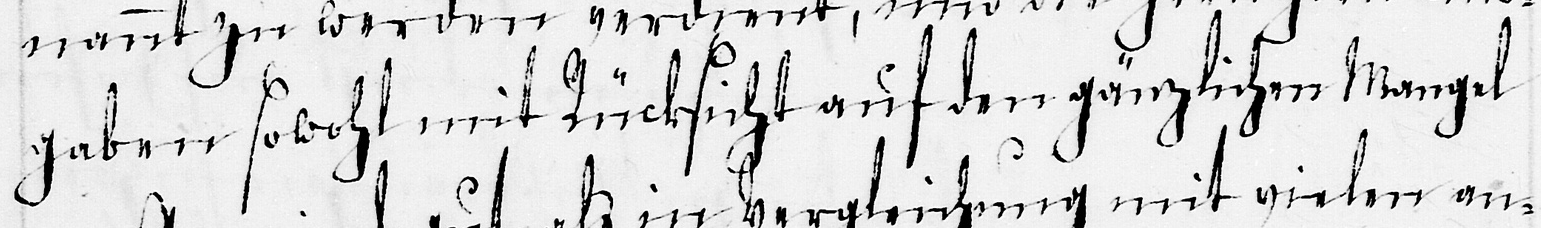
gaben sowohl mit Rücksicht auf den gänzlichen Mangel
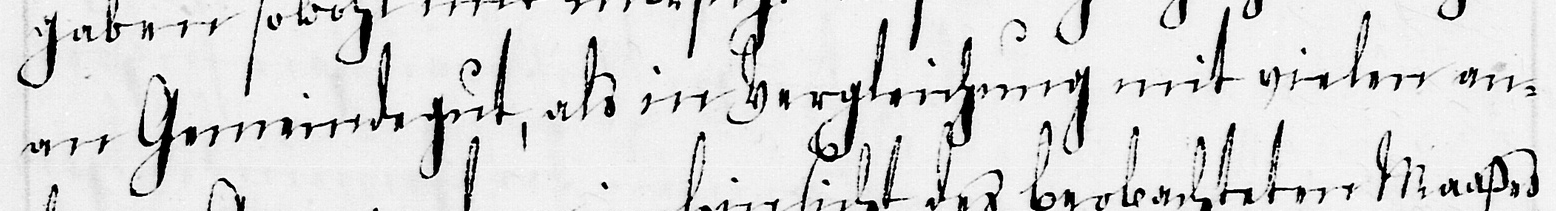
an Gemeindegut, als in Vergleichung mit vielen an¬
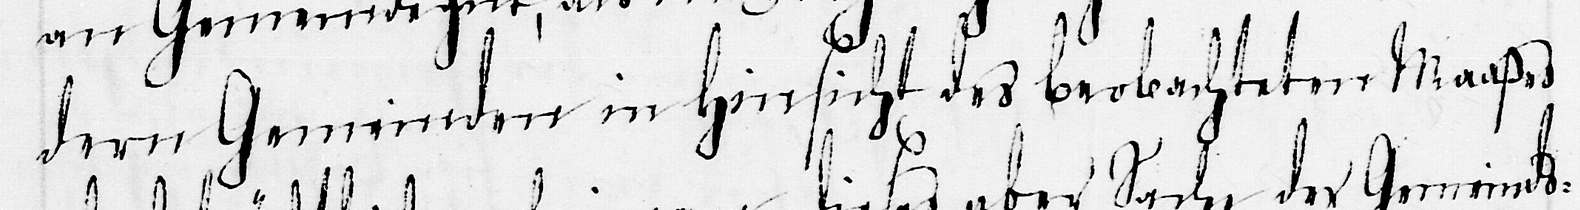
dern Gemeinden in Hinsicht des beobachteten Maaßes
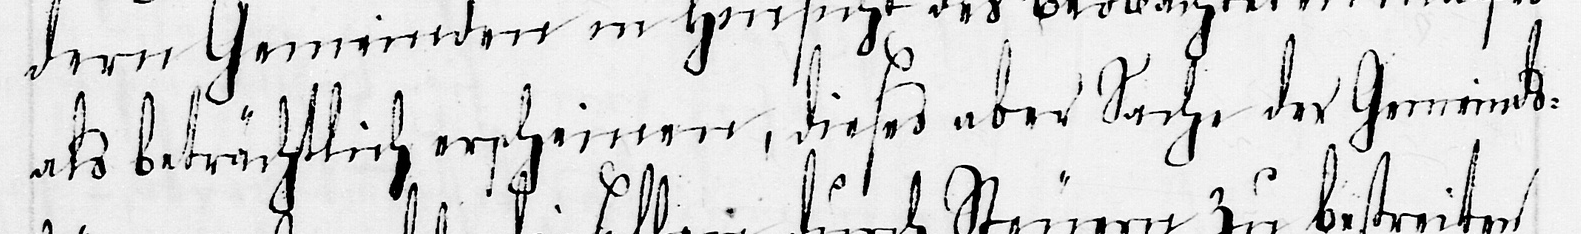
als beträchtlich erscheinen, dieses aber Sache der Gemeinds¬
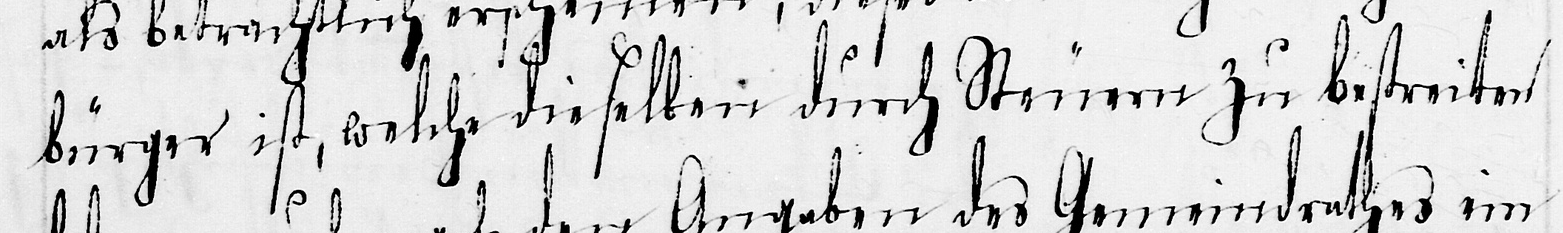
bürger ist, welche dieselben durch Steuern zu bestreiten
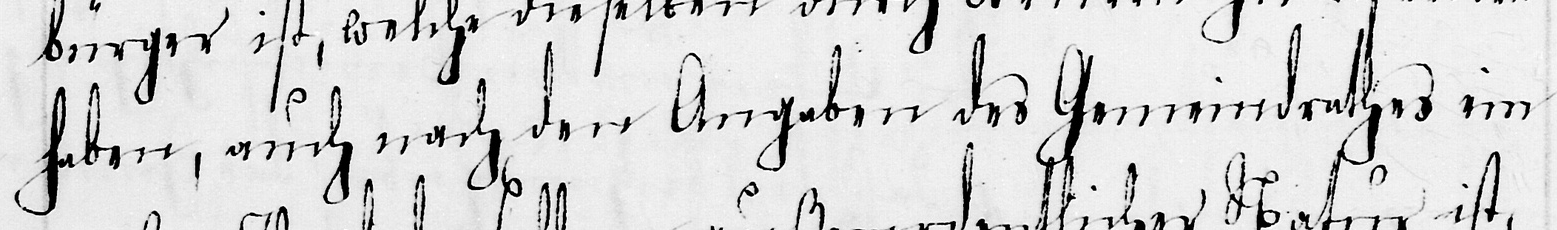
haben, auch nach den Angaben des Gemeindrathes ein
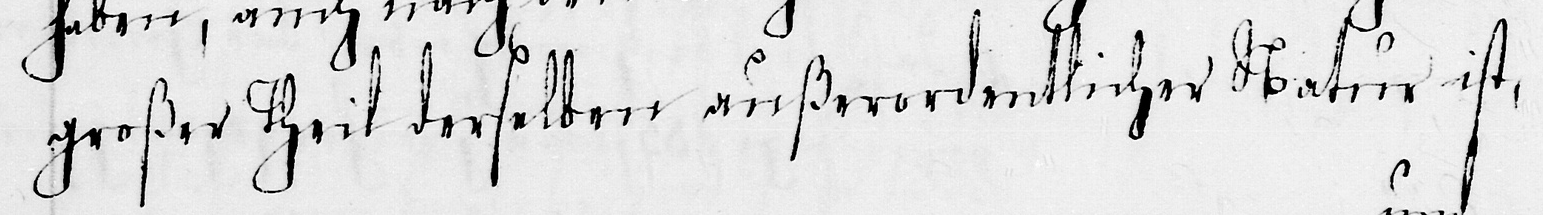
großer Theil derselben außerordentlicher Natur ist,
